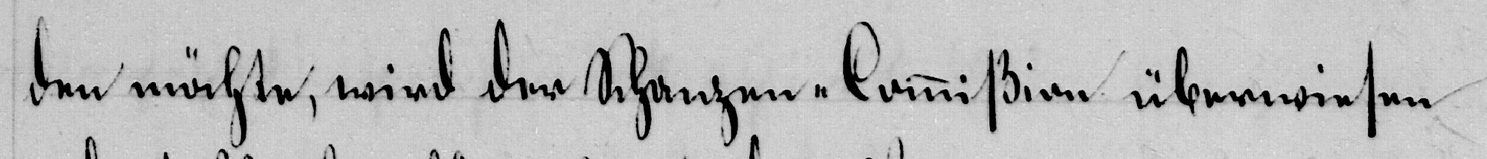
den möchte, wird der Schanzen-Commißion überwiesen
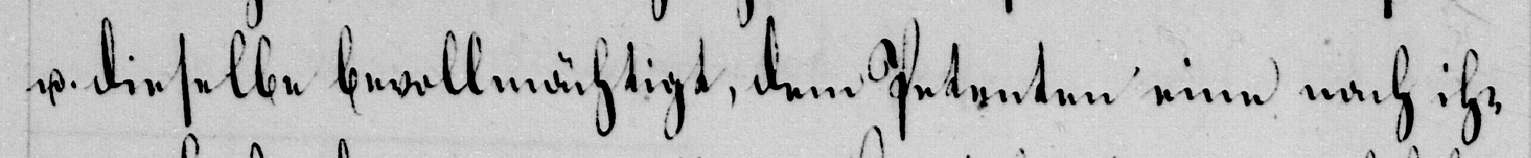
u. dieselbe bevollmächtigt, dem Petenten eine nach ih¬
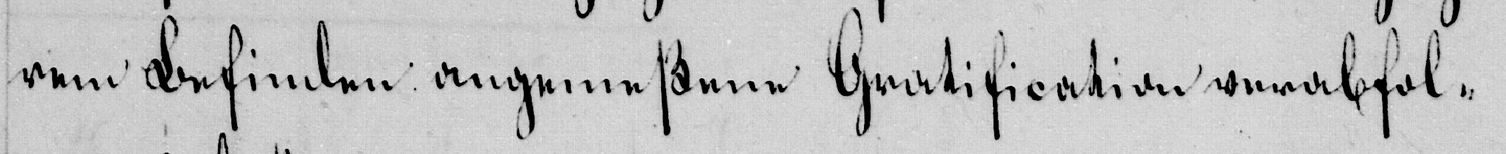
rem Befinden angemeßene Gratification verabfol¬
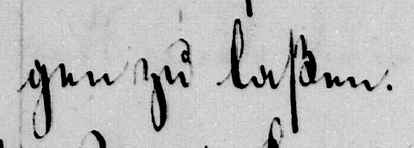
gen zu laßen.
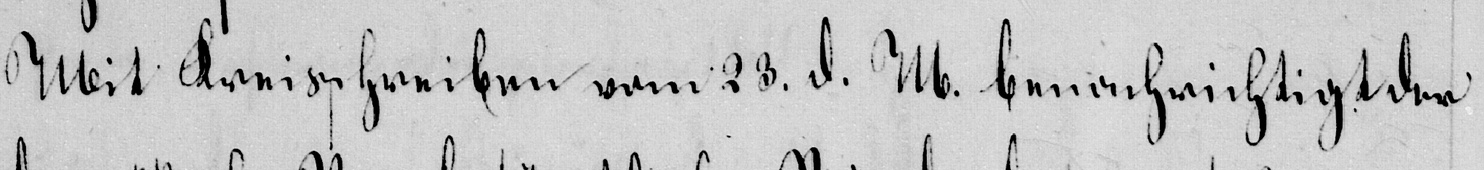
Mit Kreisschreiben vom 23. d. M. benachrichtigt der
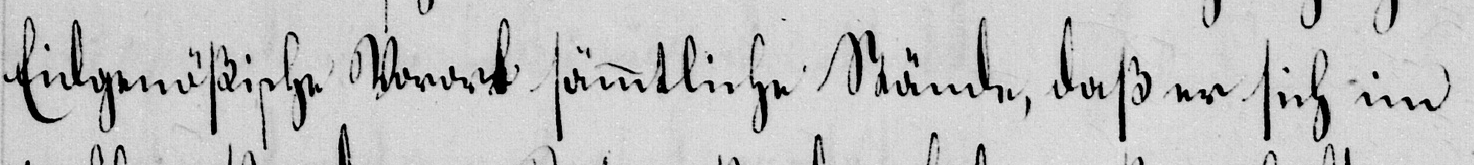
Eidgenößische Vorort sämmtliche Stände, daß er sich im
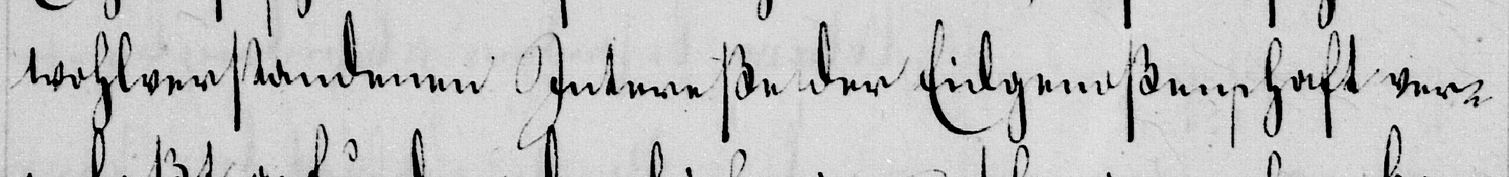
wohlverstandenen Intereße der Eidgenoßenschaft ver¬
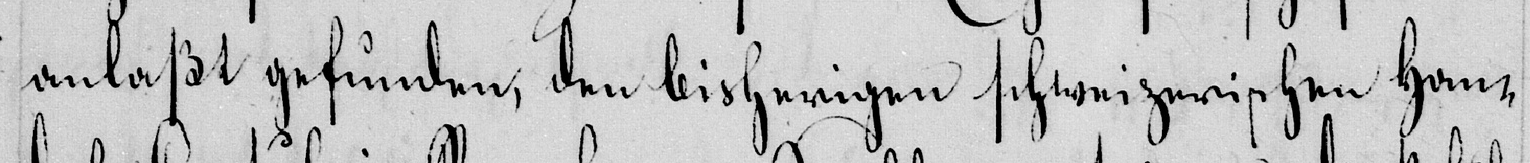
anlaßt gefunden, den bisherigen schweizerischen Han¬
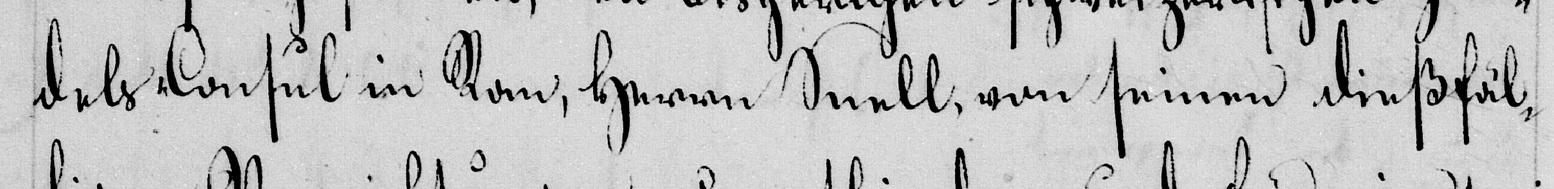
dels-Consul in Rom, Herrn Snell, von seinen dießfäl¬
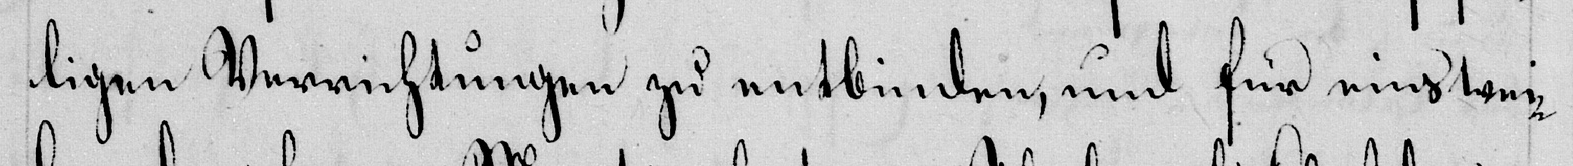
ligen Verrichtungen zu entbinden, und für einstwei¬
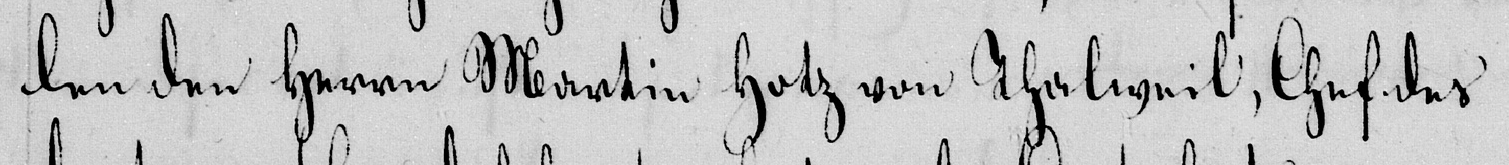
len den Herrn Martin Hotz von Thalweil, Chef des
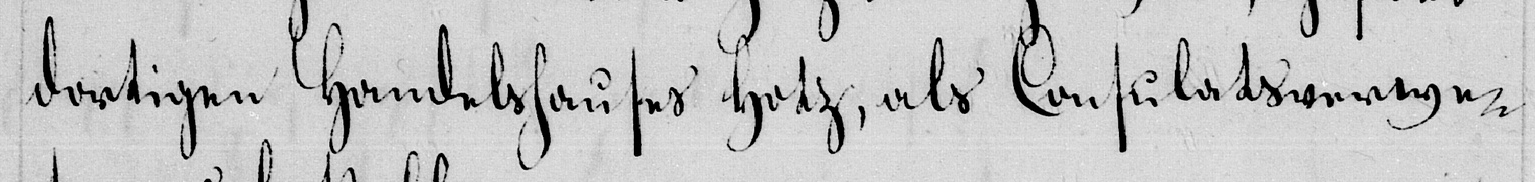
dortigen Handelshauses Hotz, als Consulatsverwe¬
